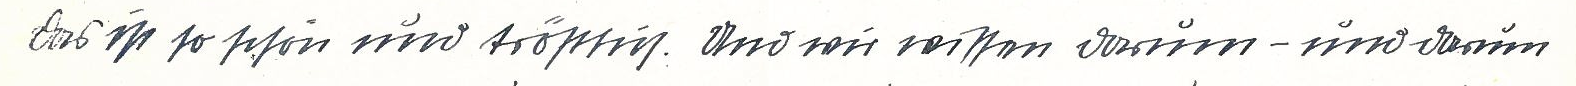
Das ist so schön und tröstlich. Und wir wissen darum – und darum
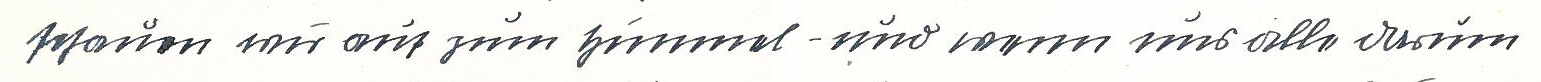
schauen wir auf zum Himmel – und wenn uns alle darum
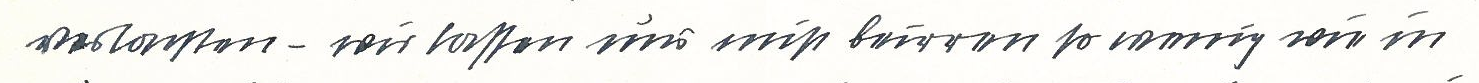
verlachen – wir lassen uns nicht beirren so wenig wie in
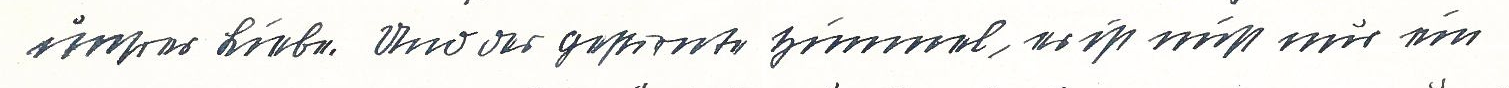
unsrer Liebe. Und der gestirnte Himmel, er ist nicht nur ein
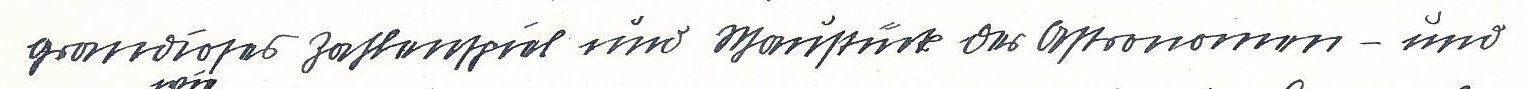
grandioses Zahlenspiel und Schaustück der Astronomen – und
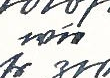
wie
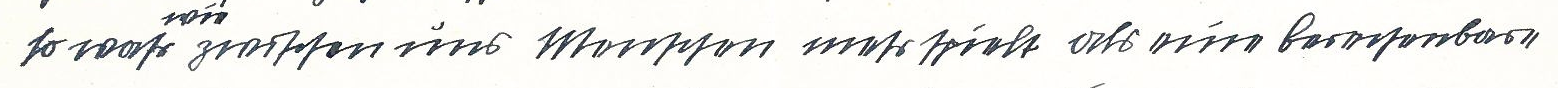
so wahr zwischen uns Menschen mehr spielt als eine berechenbare
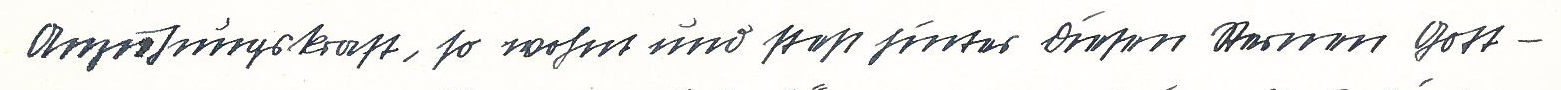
Anziehungskraft, so wohnt und steht hinter diesen Sternen Gott –
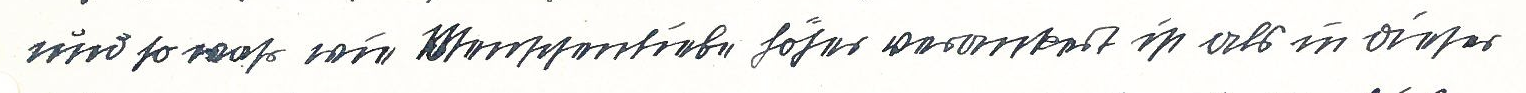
und so wahr wie Menschenliebe höher verankert ist als in dieser
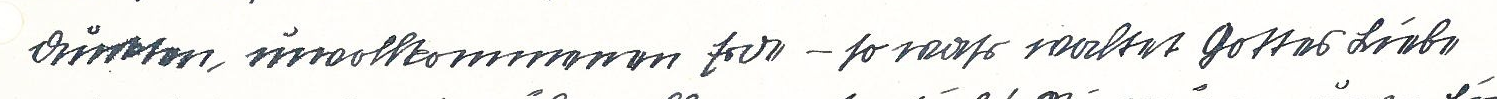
dunklen, unvollkommenen Erde – so wahr waltet Gottes Liebe
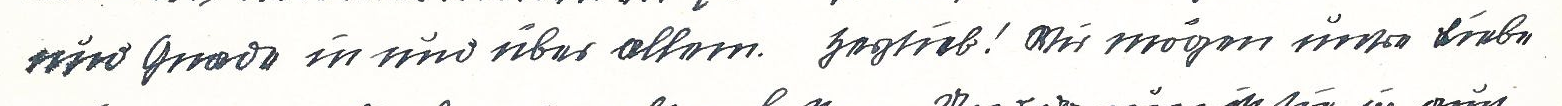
und Gnade in uns über allem. Herzlieb! Wir mögen uns unsre Liebe
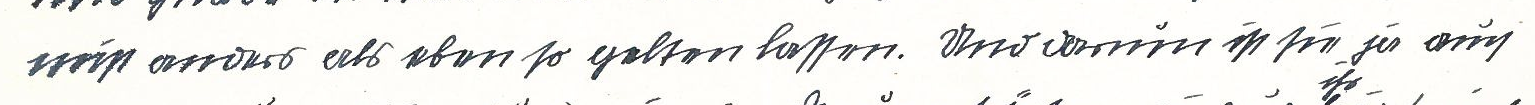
nicht anders als eben so gelten lassen. Und darum ist sie ja auch
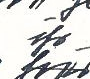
ihr
